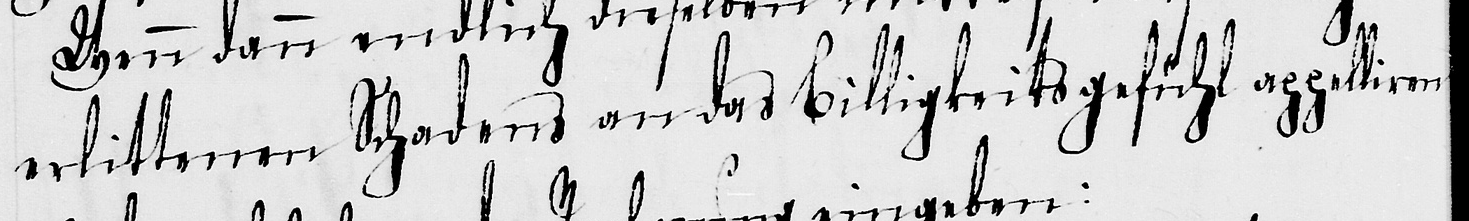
erlittenen Schadens an das Billigkeitsgefühl appelli¬
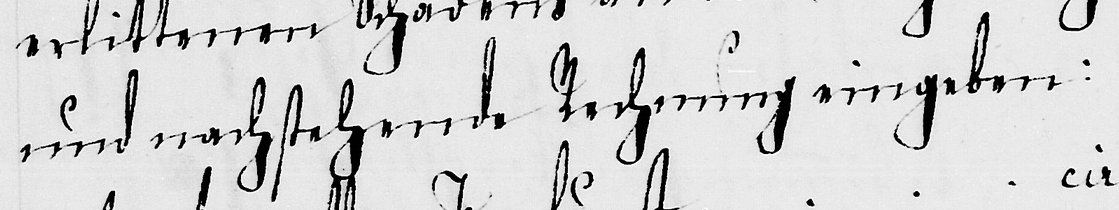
und nachstehende Rechnung eingeben:
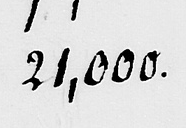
21,000.
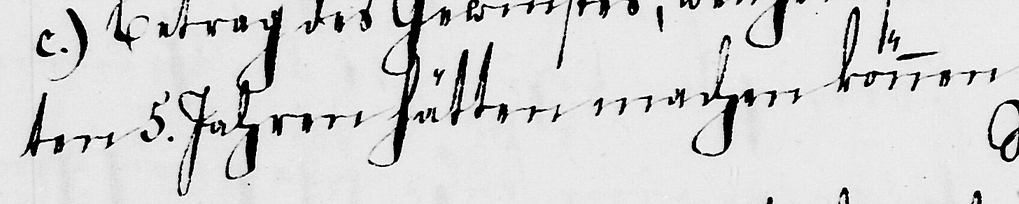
ten 5. Jahren hätten machen können
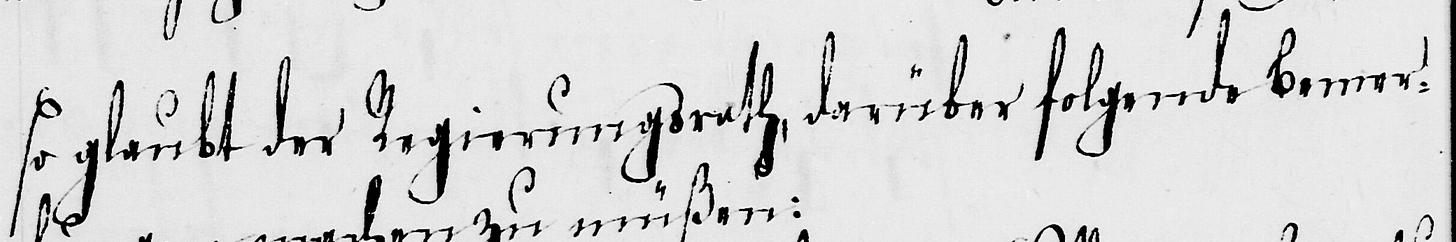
so glaubt der Regierungsrath, darüber folgende Bemer¬
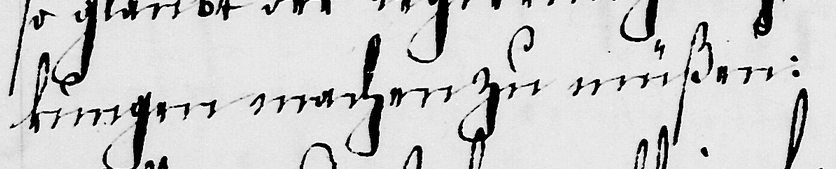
kungen machen zu müßen:
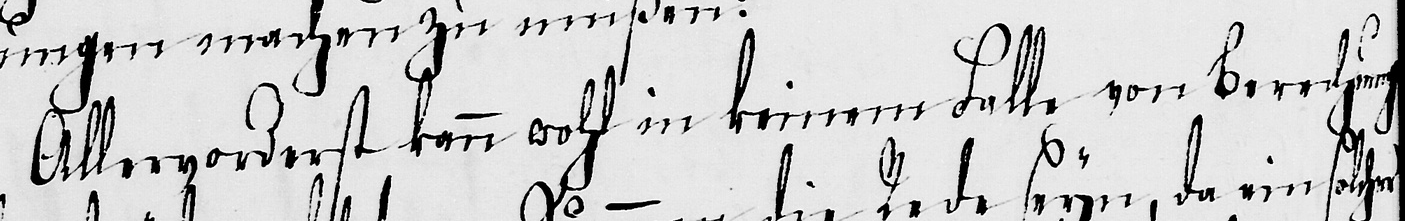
Allervorderst kann wohl in keinem Falle von Berechn¬
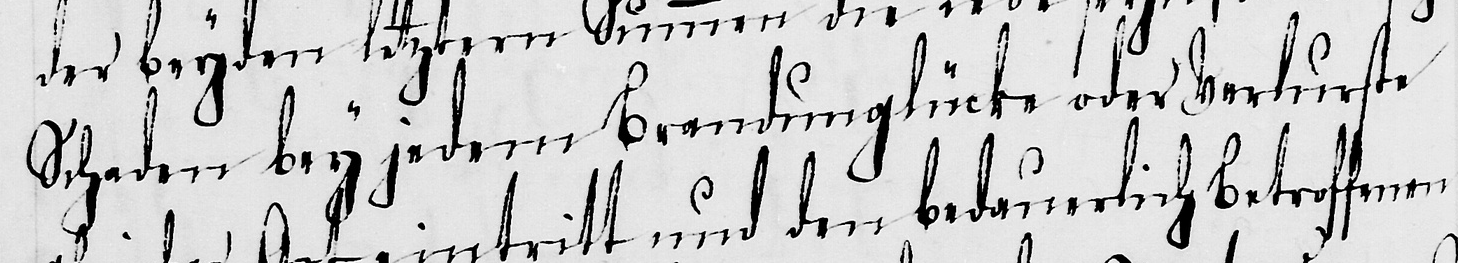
Schaden bey jedem Brandunglücke oder Verluste
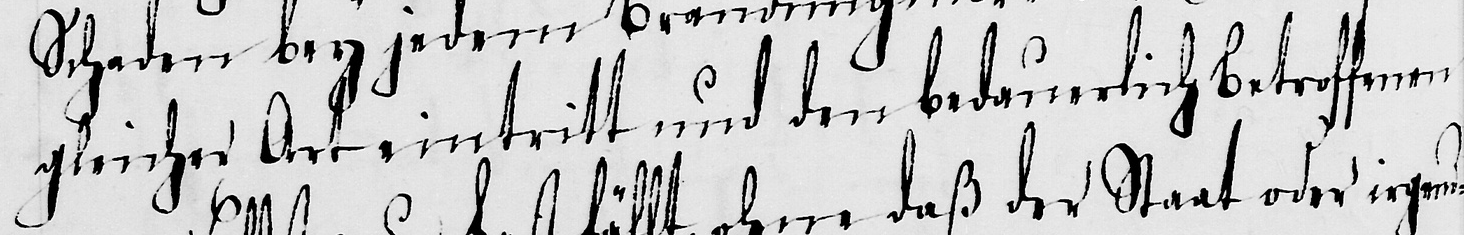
gleicher Art eintritt und den bedauerlich Betroffen¬
